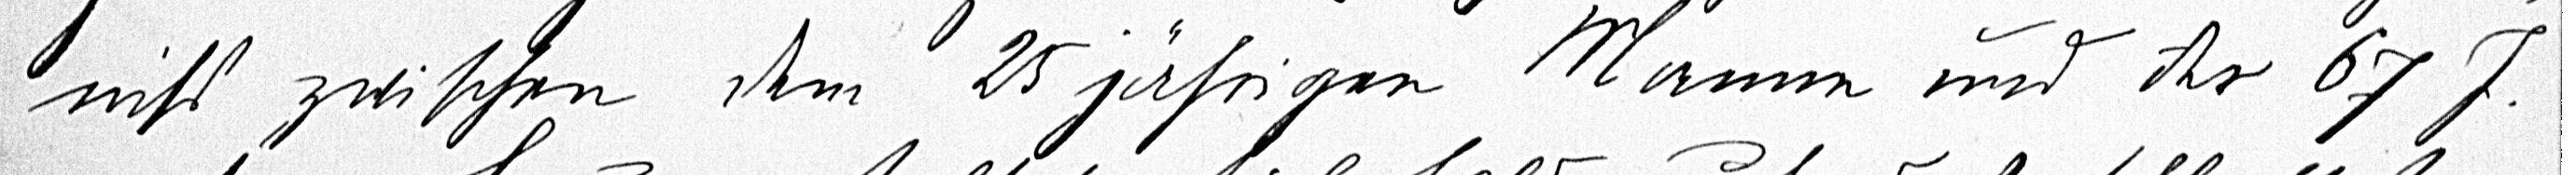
niss zwischen dem 25jährigen Manne und der 67 J.
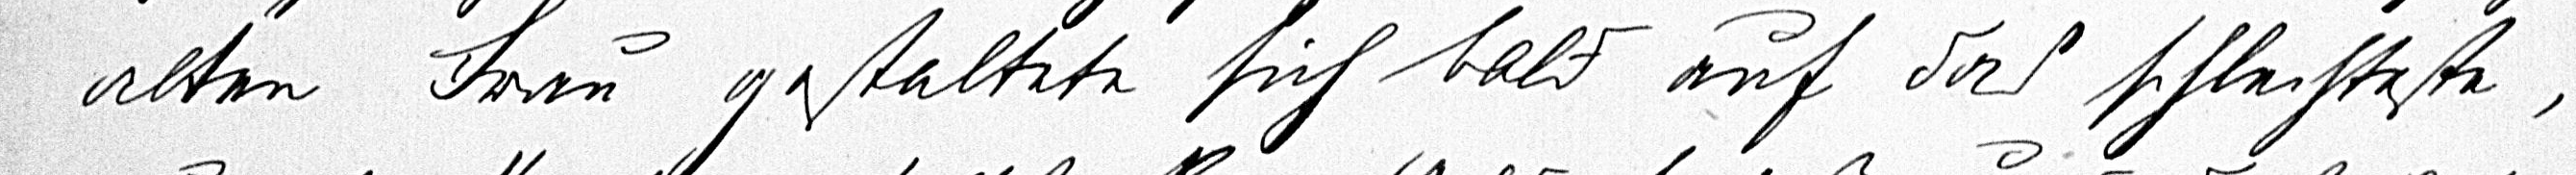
alten Frau gestaltete sich bald auf das schlechteste,
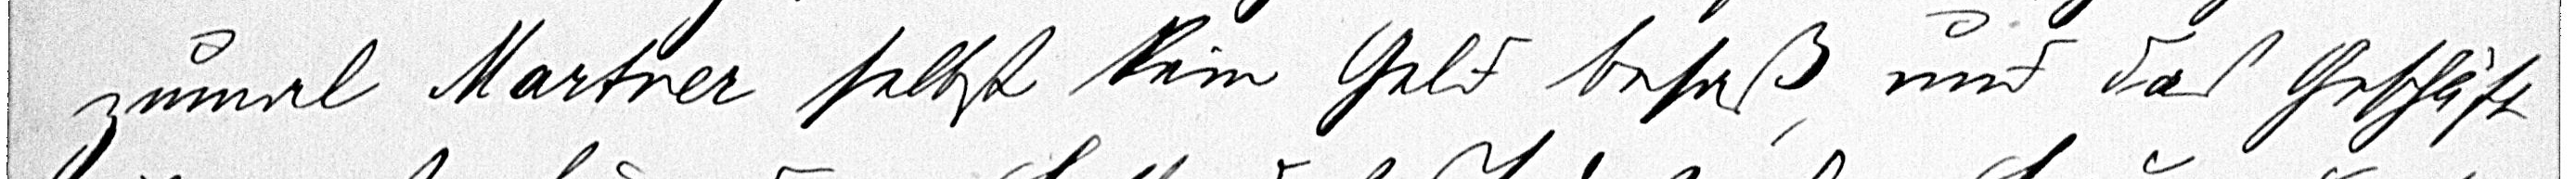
zumal Martner selbst kein Geld besaß, und das Geschäft
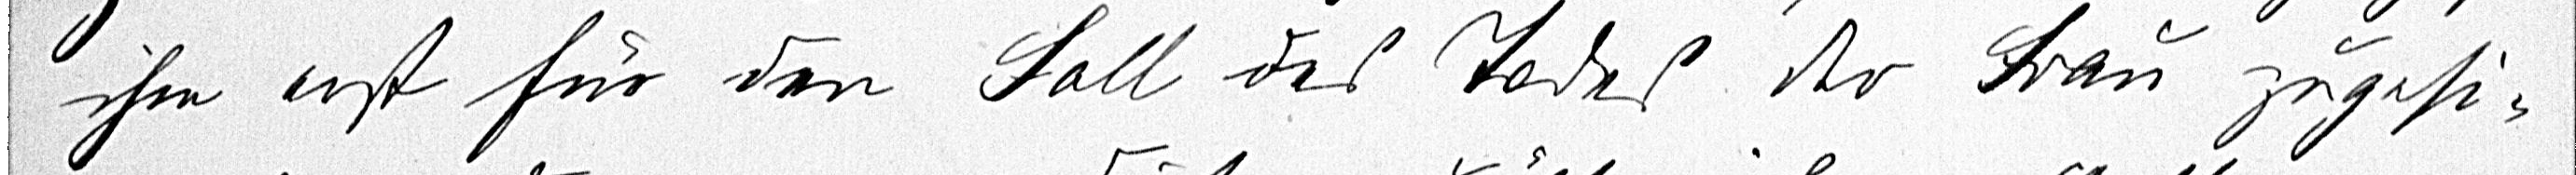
ihre erst für den Fall des Todes der Frau zugesi¬
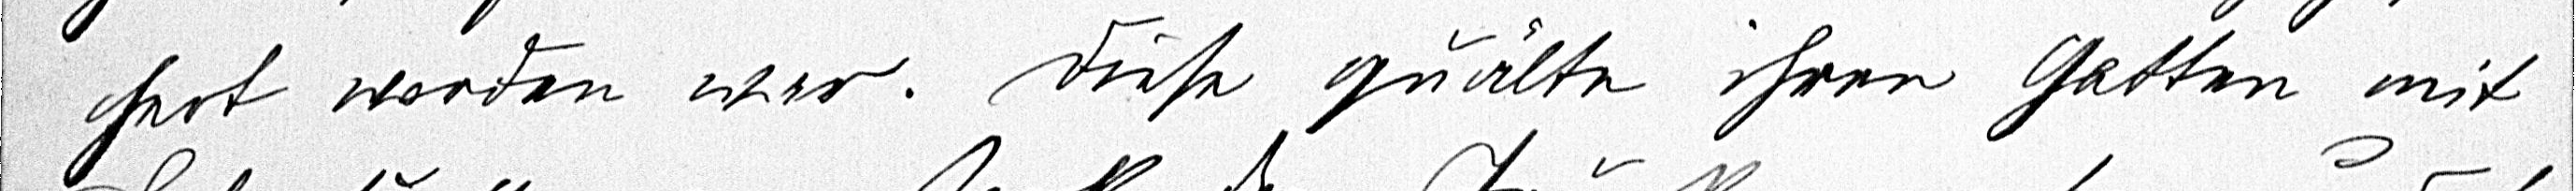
chert worden war. Diese quälte ihren Gatten mit
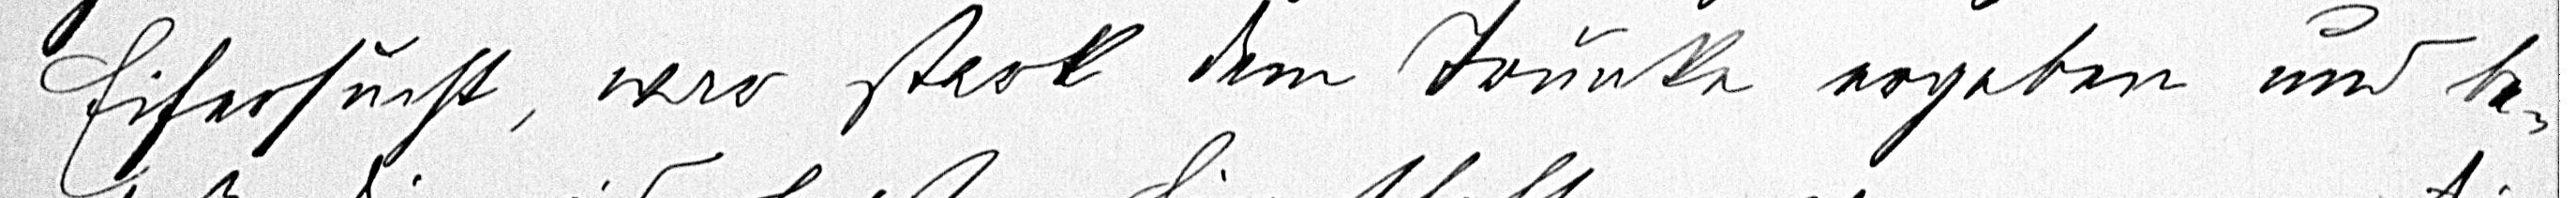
Eifersucht, war stark dem Trunke ergeben und be¬
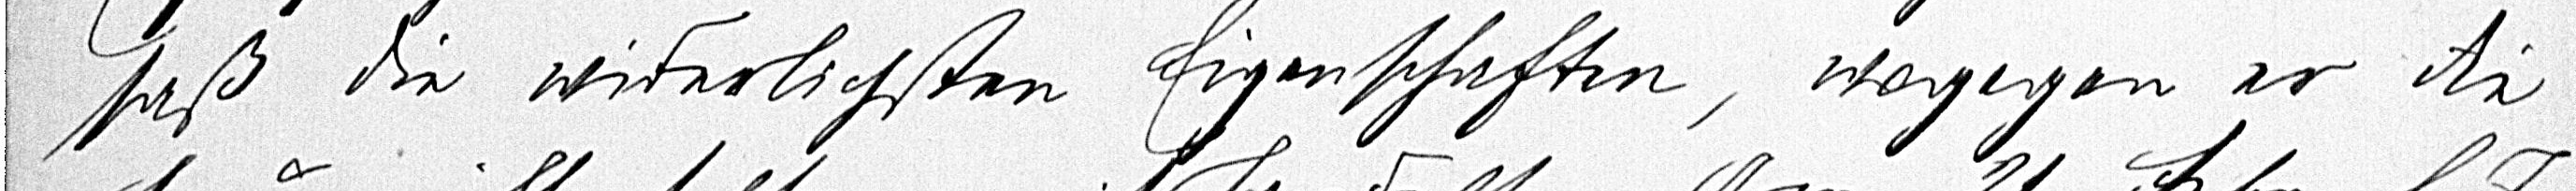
saß die widerlichsten Eigenschaften, wogegen er die
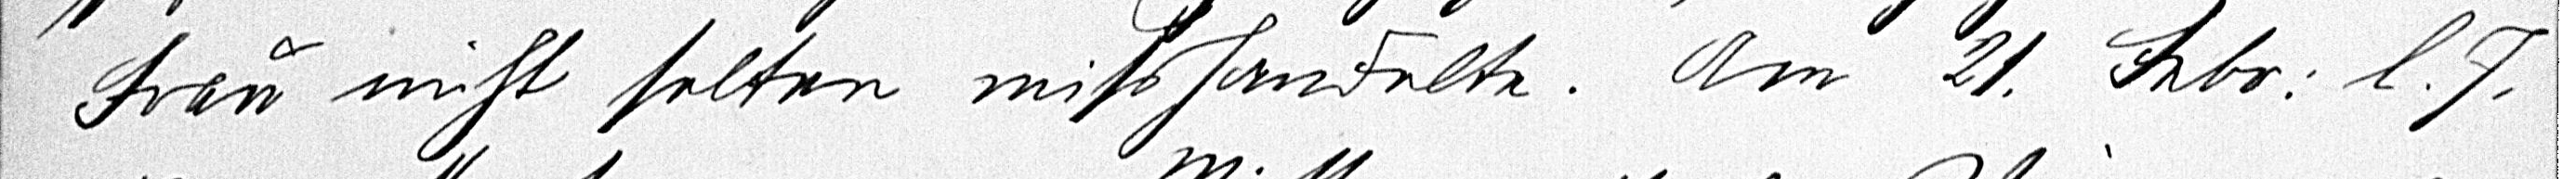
Frau nicht selten misshandelte. Am 21. Febr. l. J.
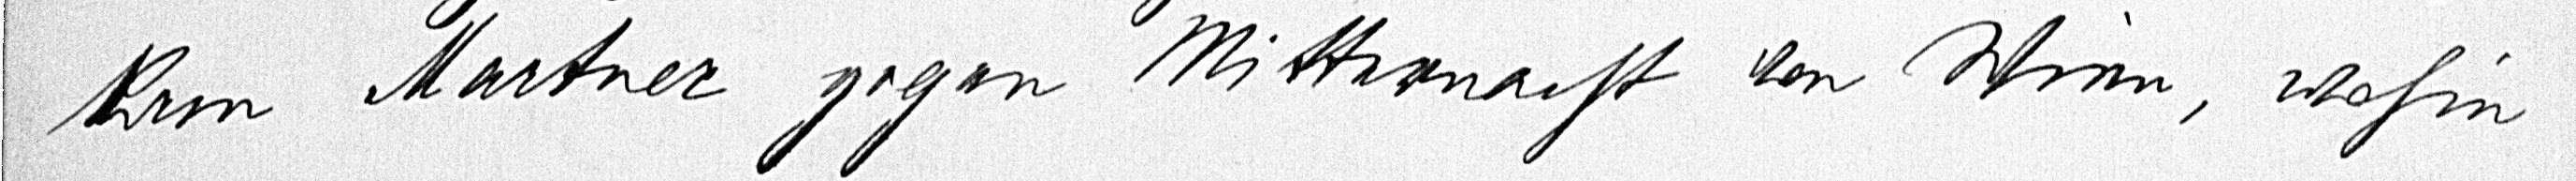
kam Martner gegen Mitternacht von Wien, wohin
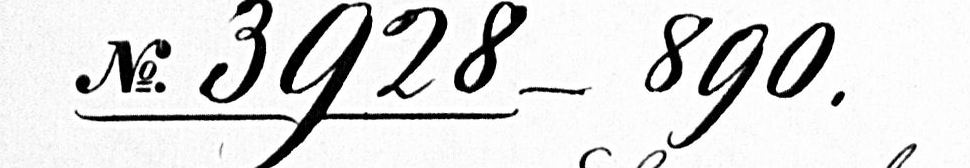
N° 3928-890.
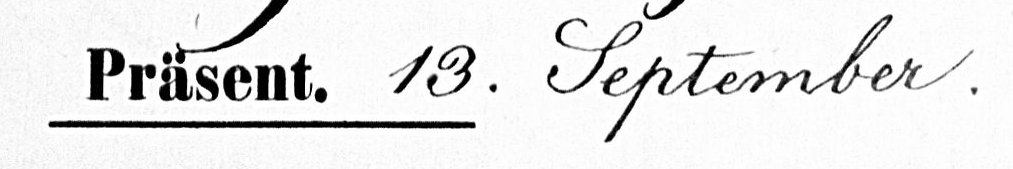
Präsent. 13. September.
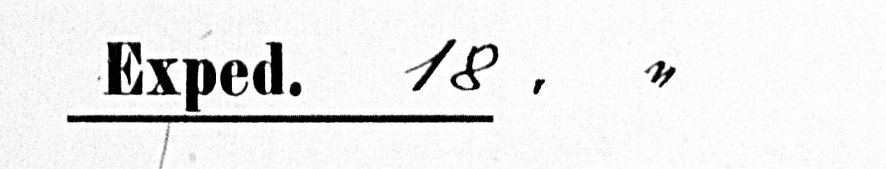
Exped. 18. September.
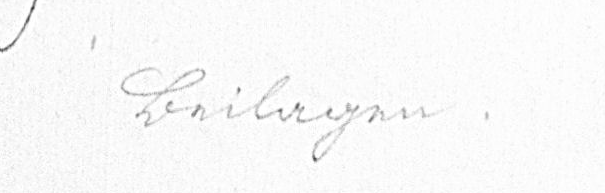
Beilagen.
